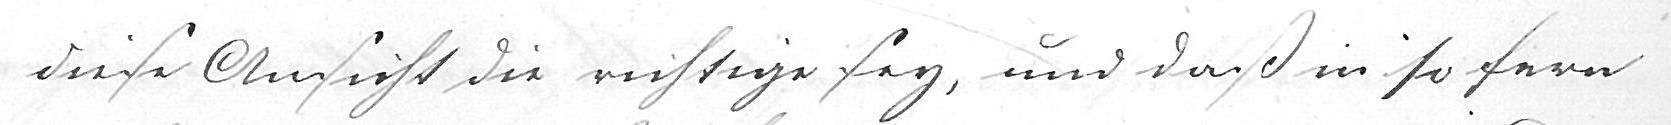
diese Ansicht die richtig sey, und daß in so fern
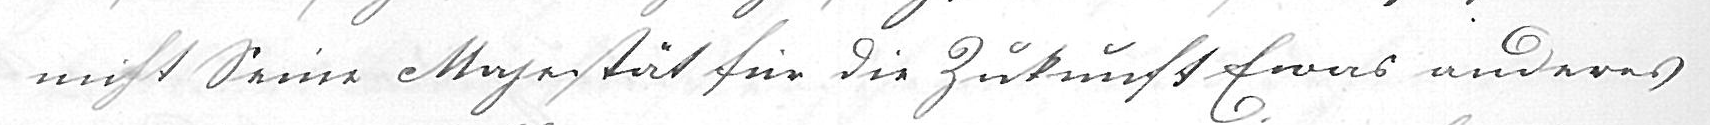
nicht Seine Majestät für die Zukunft Ewas anderes
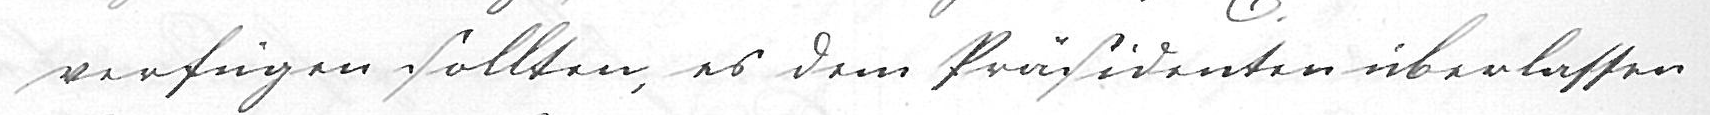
verfügen sollten, es dem Präsidenten überlassen
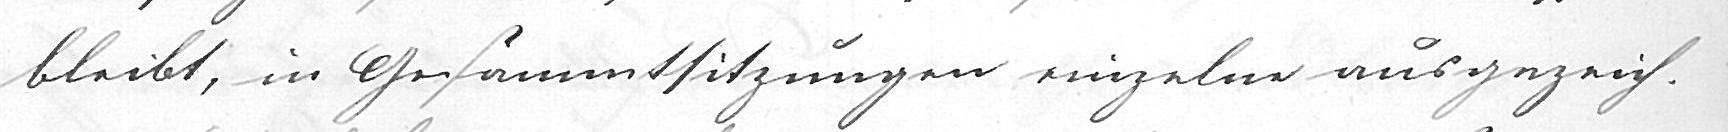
bleibt, in Gesammtsitzungen einzelne ausgezeich-
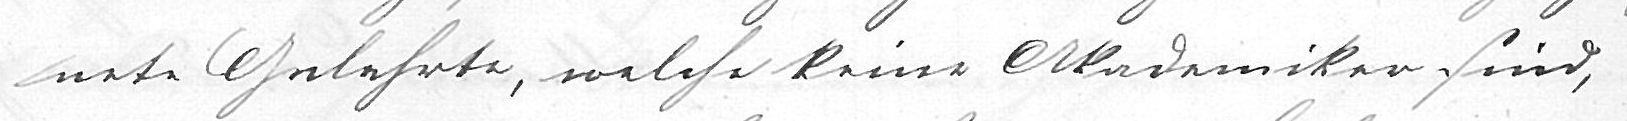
nete Gelehrte, welche keine Akademiker sind,
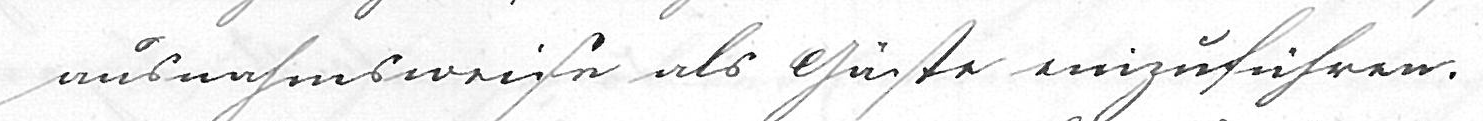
ausnahmsweise als Gäste einzuführen.
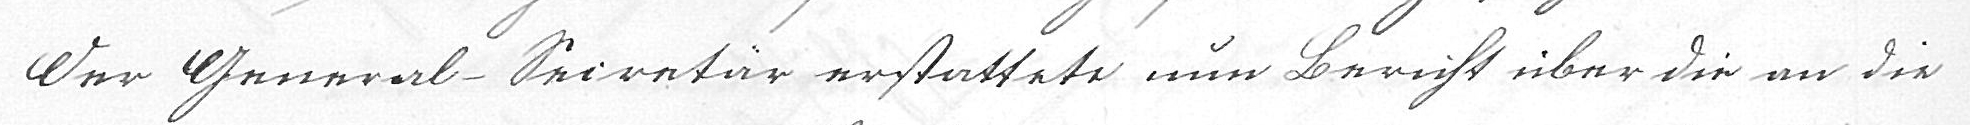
Der General-Secretär erstattete nun Bericht über die an die
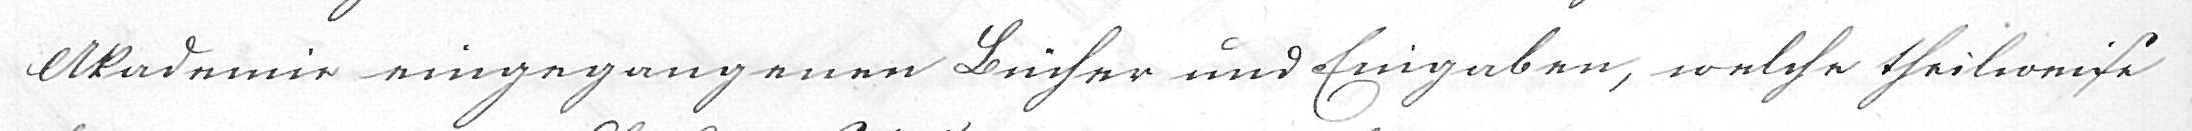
Akademie eingegangenen Bücher und Eingaben, welche theilweise
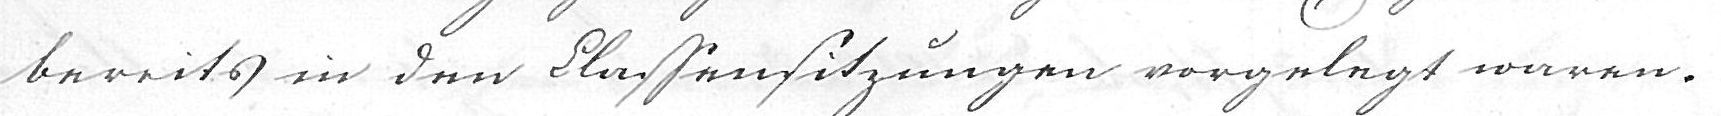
bereits in den Classensitzungen vorgelegt waren.
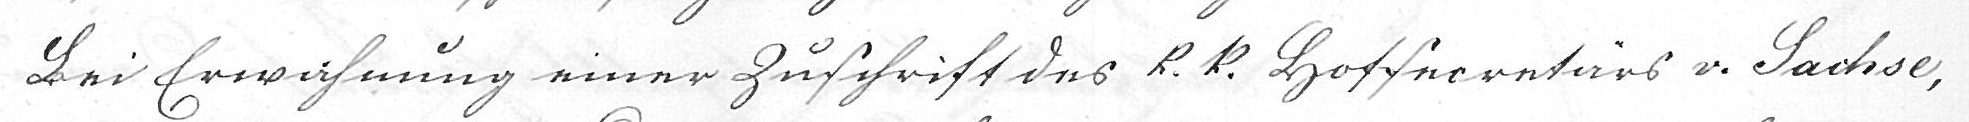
Bei Erwähnung einer Zuschrift des k.k. Hofsecretärs v. Sachse,
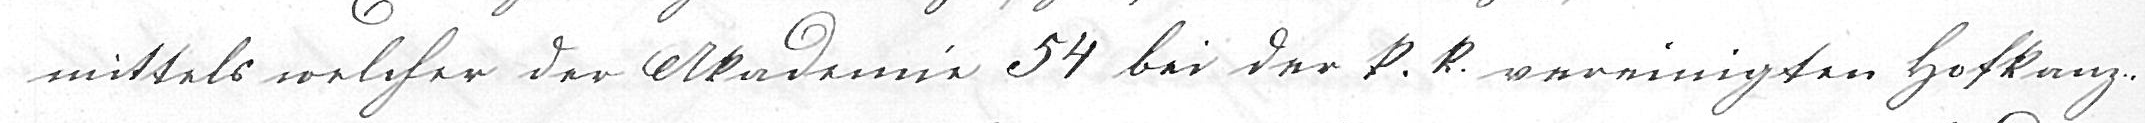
mittels welcher der Akademie 54 bei der k.k. vereinigten Hofkanz-
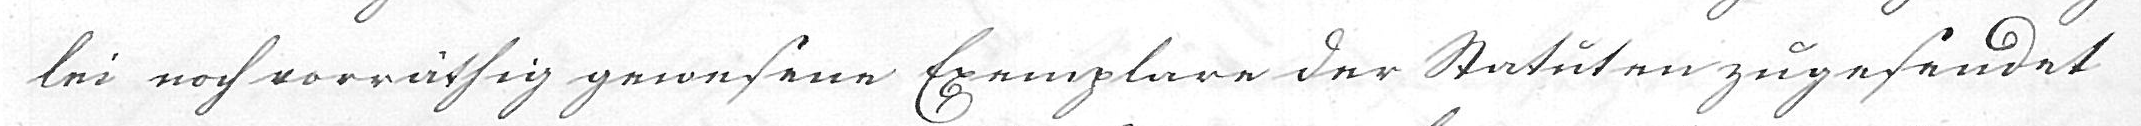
lei noch vorräthig gewesene Exemplare der Statuten zugesendet
